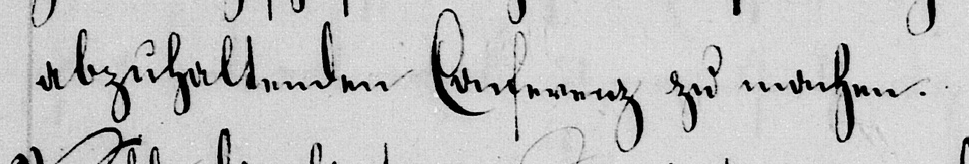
abzuhaltenden Conferenz zu machen.
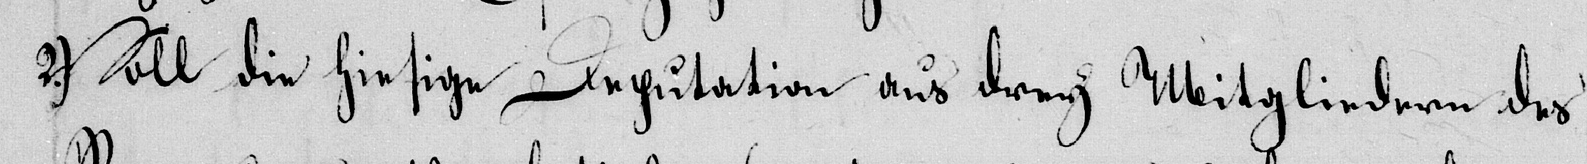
2.) Soll die hiesige Deputation aus drey Mitgliedern des
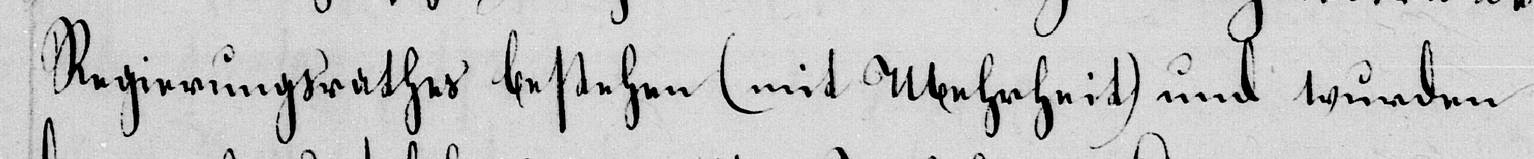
Regierungsrathes bestehen (mit Mehrheit) und wurden
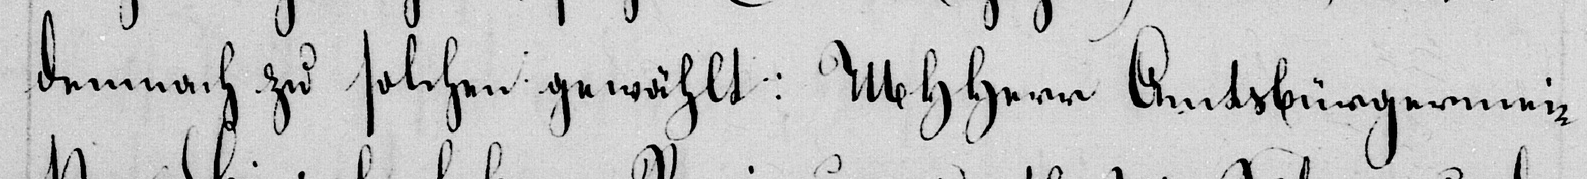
demnach zu solchen gewählt: MHHerr Amtsbürgermei¬
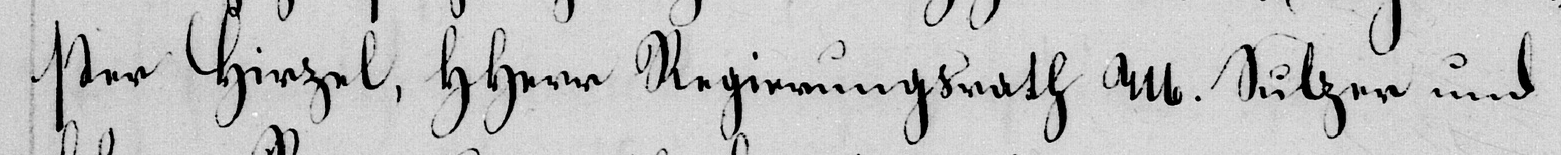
ster Hirzel, HHerr Regierungsrath M. Sulzer und
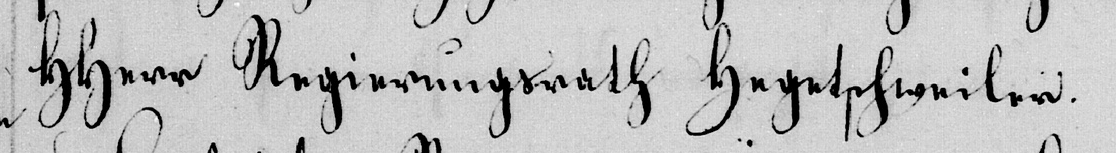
HHerr Regierungsrath Hegetschweiler.
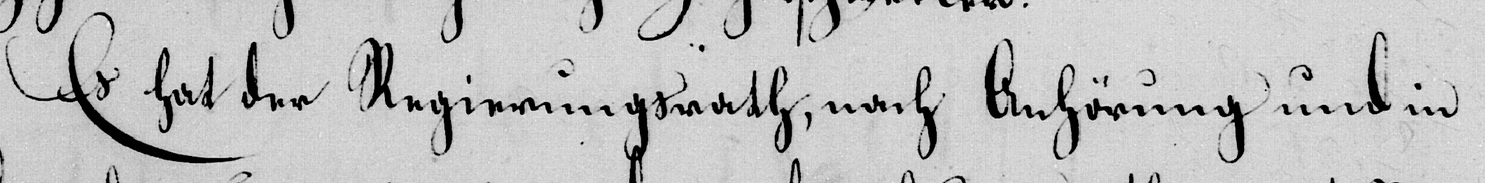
Es hat der Regierungsrath, nach Anhörung und in
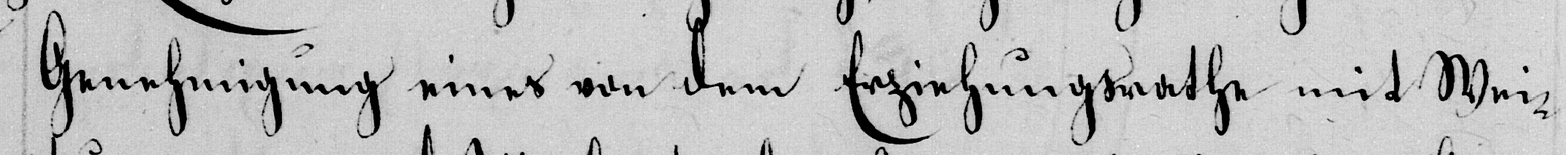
Genehmigung eines von dem Erziehungsrathe mit Wei¬
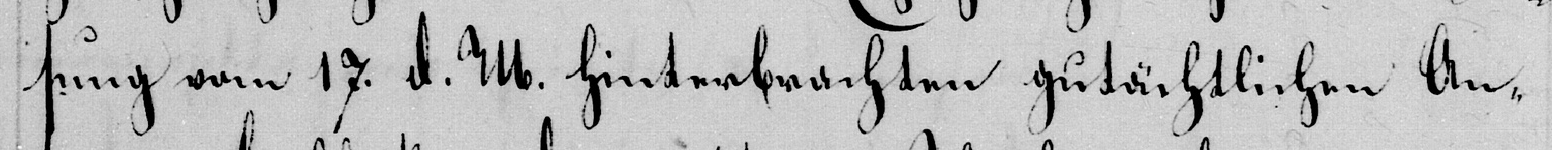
sung vom 17. d. M. hinterbrachten gutächtlichen An¬
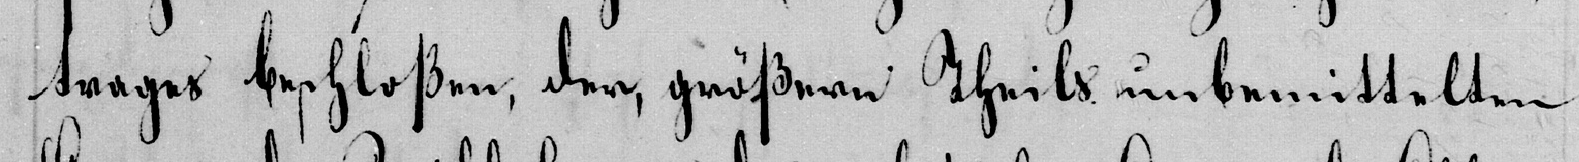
trages beschloßen, der, größern Theils unbemittelten
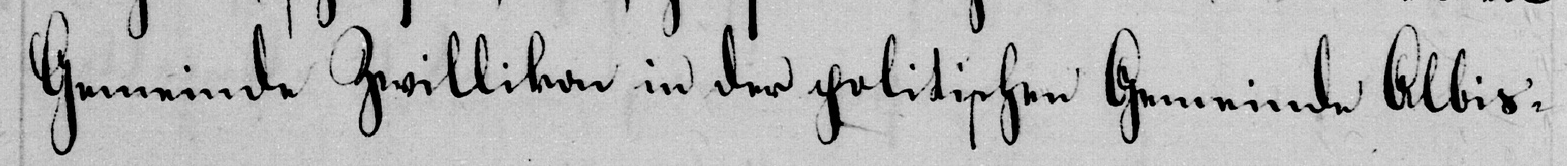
Gemeinde Zwillikon in der politischen Gemeinde Albis-
